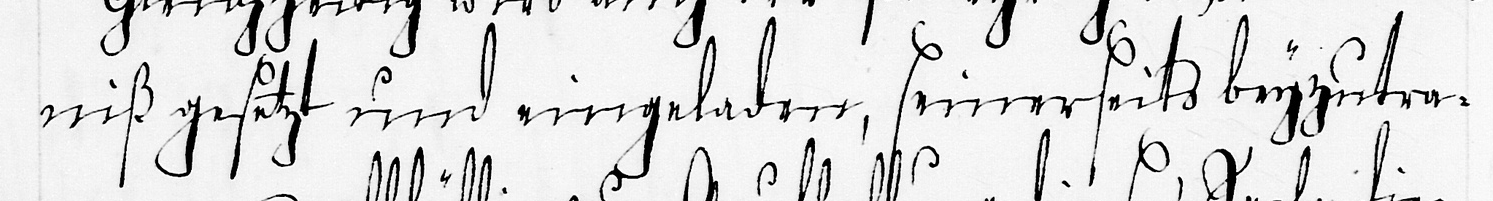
tniß gesetzt und eingeladen, seinerseits beyzutra¬
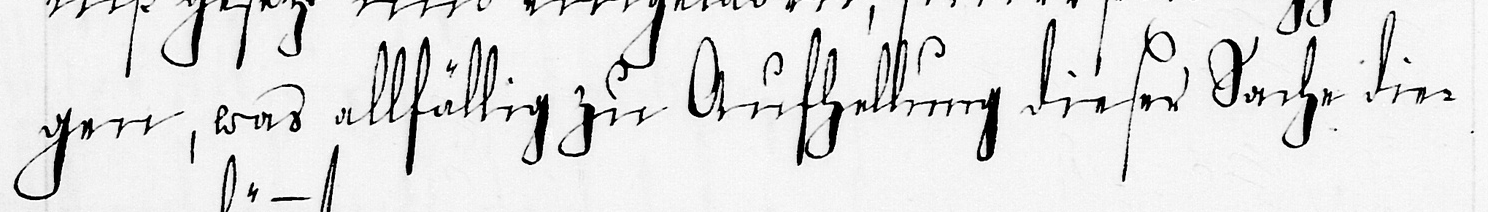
gen, was allfällig zu Aufhellung dieser Sache die¬
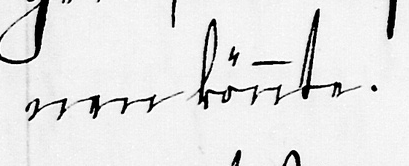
nen könnte.
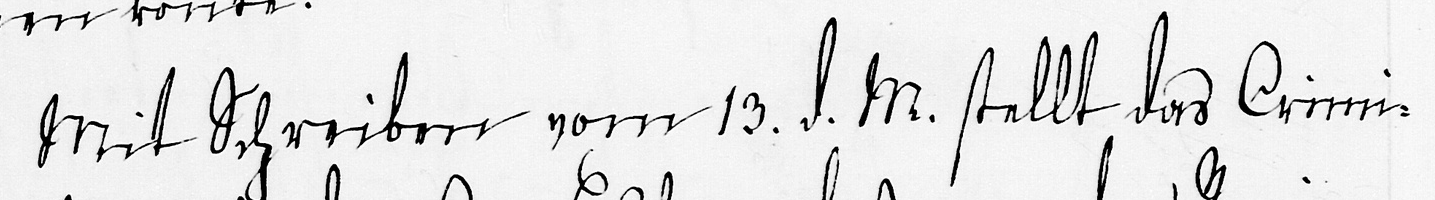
Mit Schreiben vom 13. d. M. stellt das Crimi¬
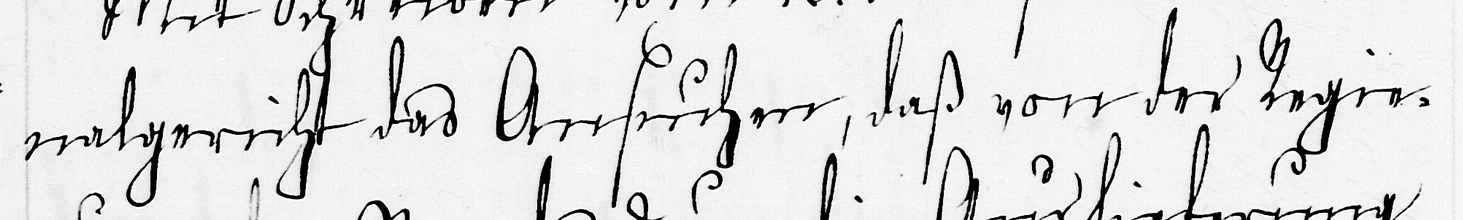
nalgericht das Ansuchen, daß von der Regie¬
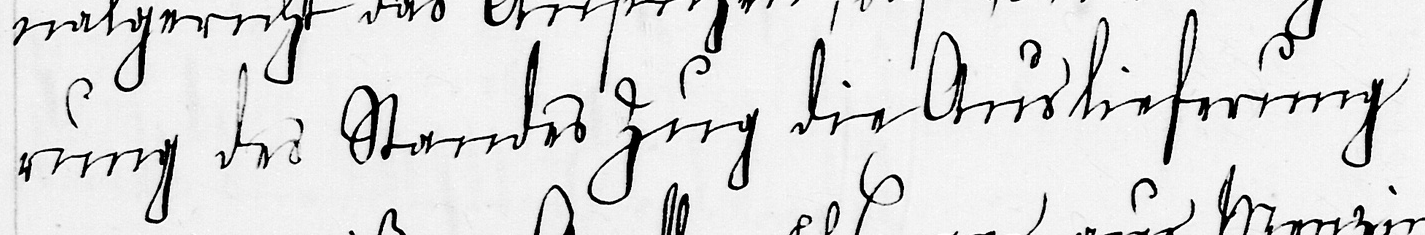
rung des Standes Zug die Auslieferung
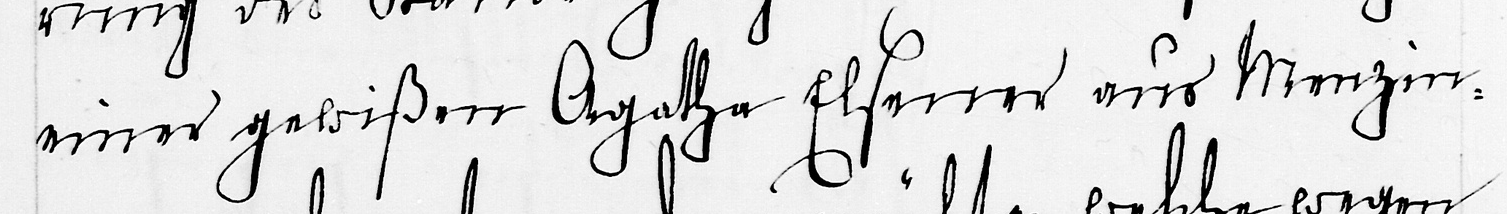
einer gewißen Agatha Elsener aus Menzin¬
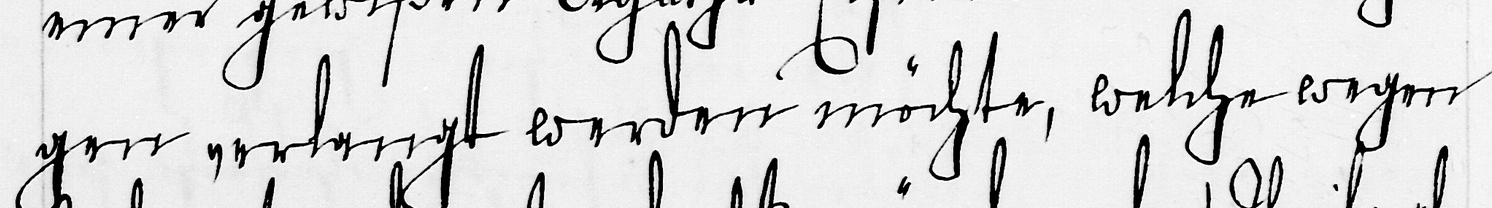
gen verlangt werden möchte, welche wegen
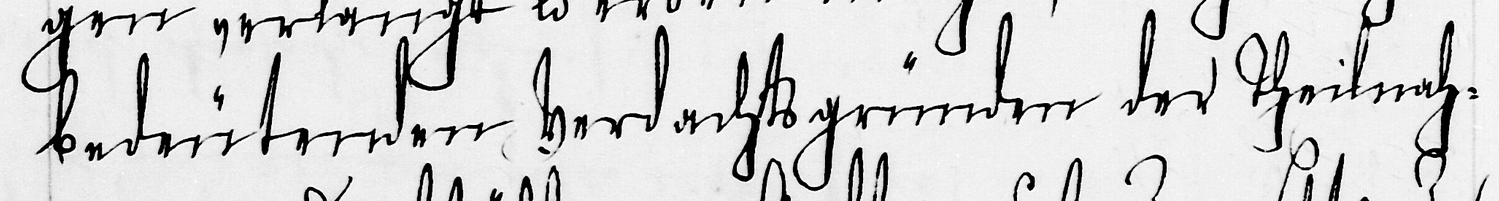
bedeutenden Verdachtsgründen der Theilnah¬
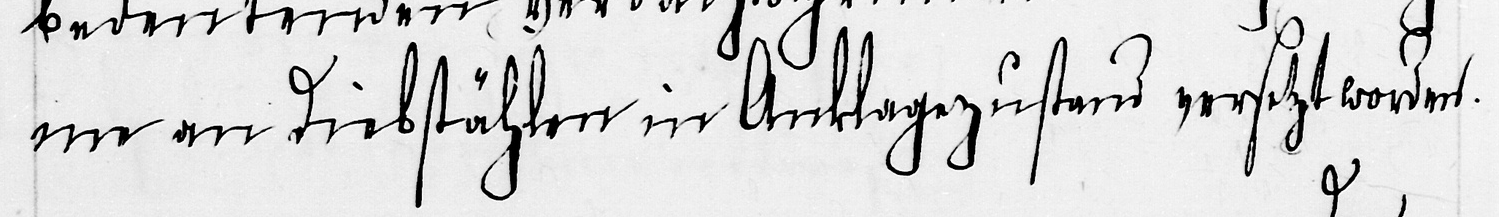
me an Diebstählen in Anklagezustand versetzt wor¬
